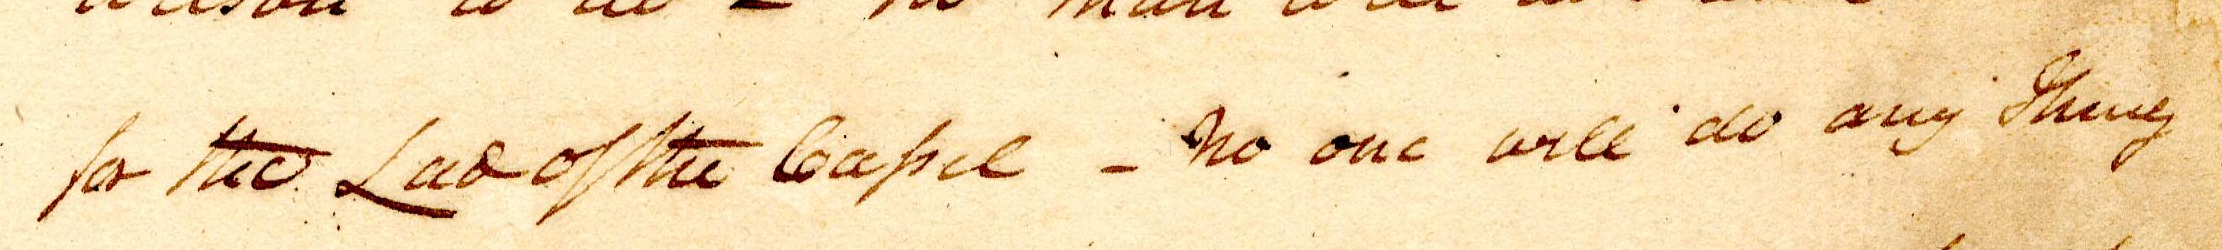for the Lad of the Capel. No one will do any thing
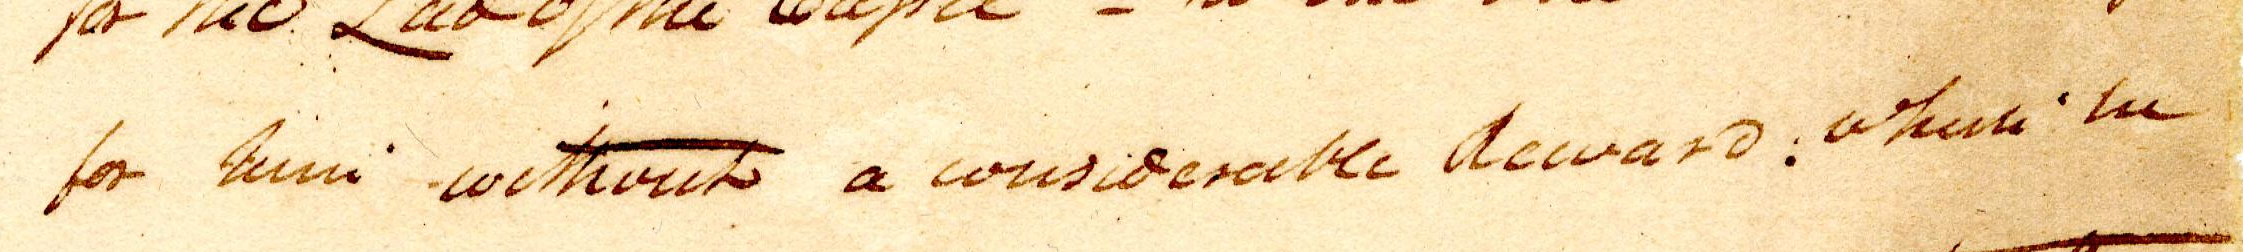for him without a considerable Reward. which he
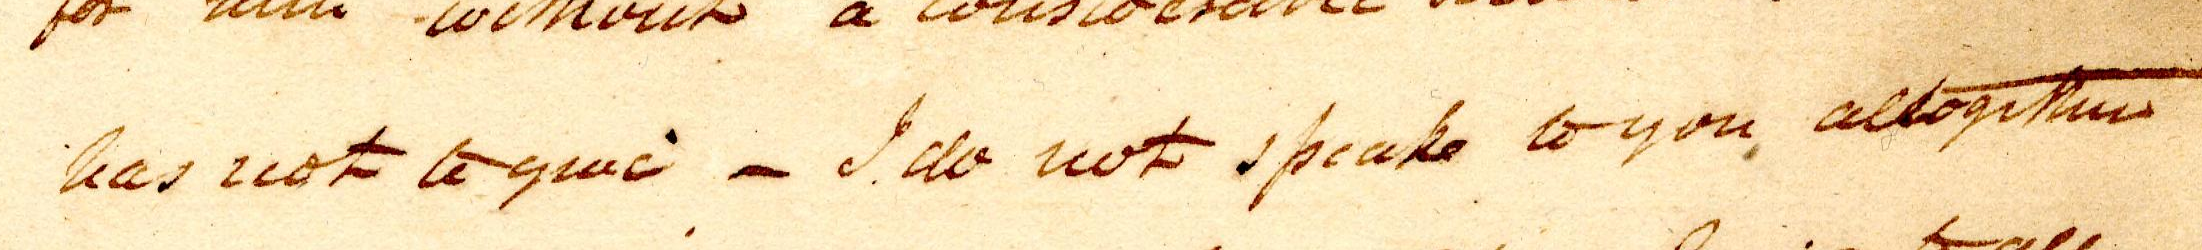has not to give. I do not speak to you, altogether
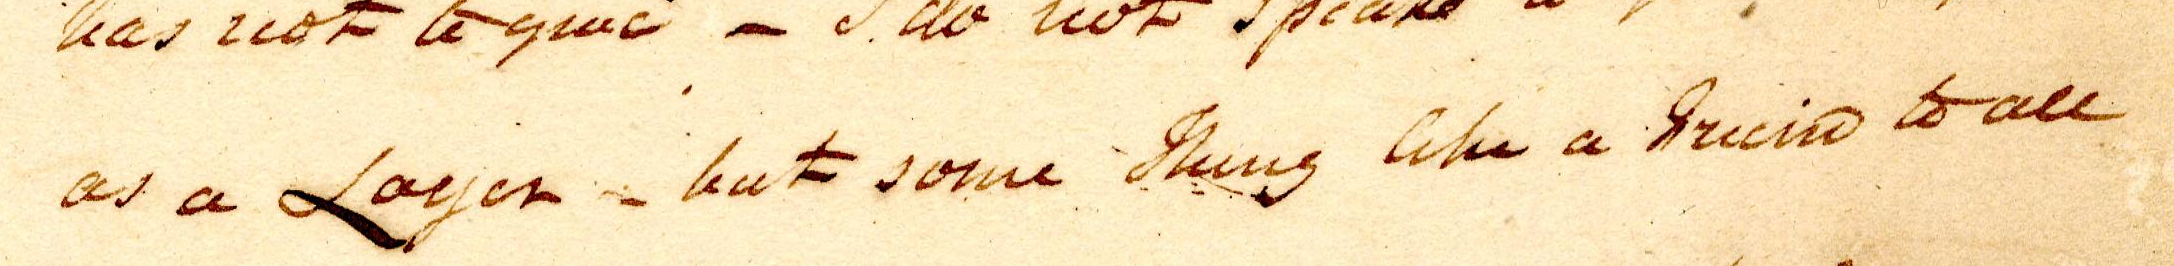as a Layer, but some Thing like a friend to all
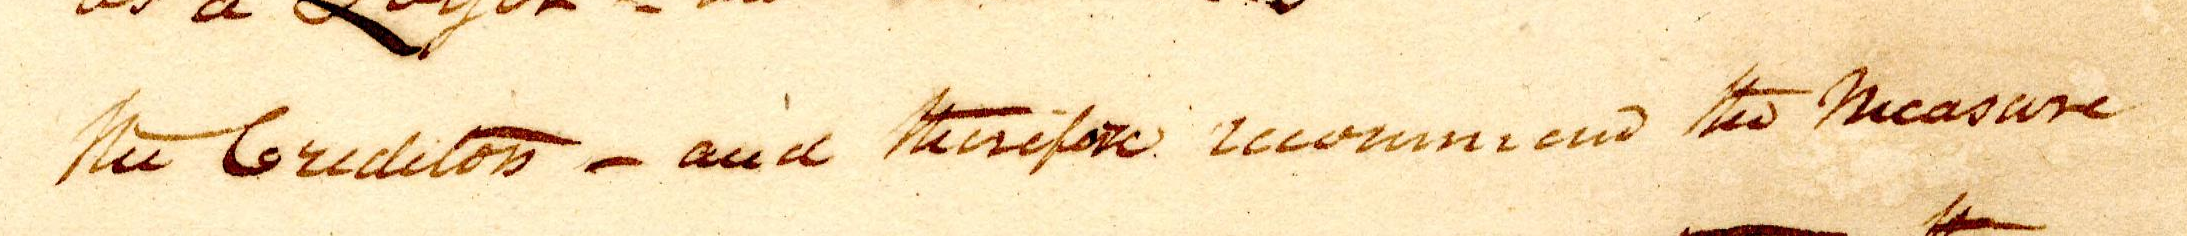the Creditors, and therefore recommend the Measure
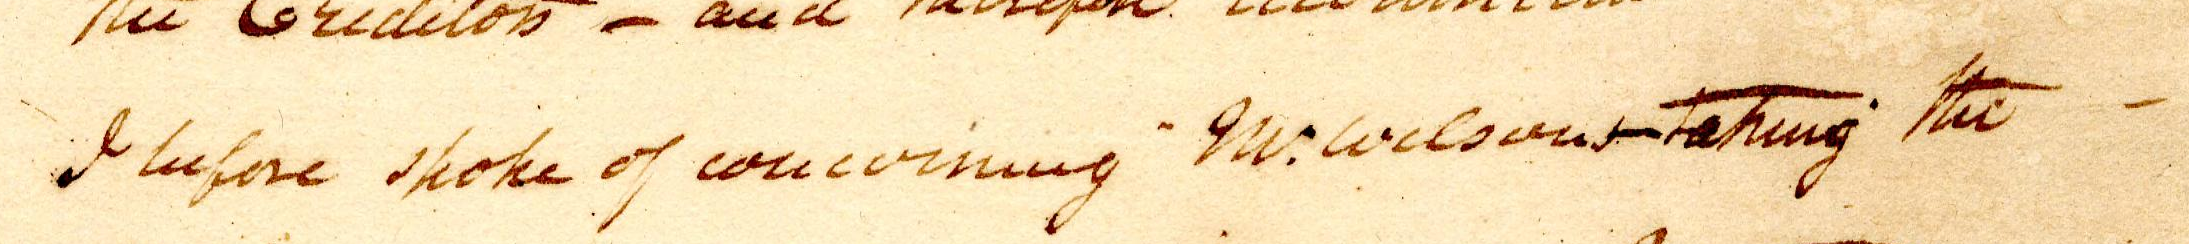I before spoke of concerning M^r Wilsons taking the
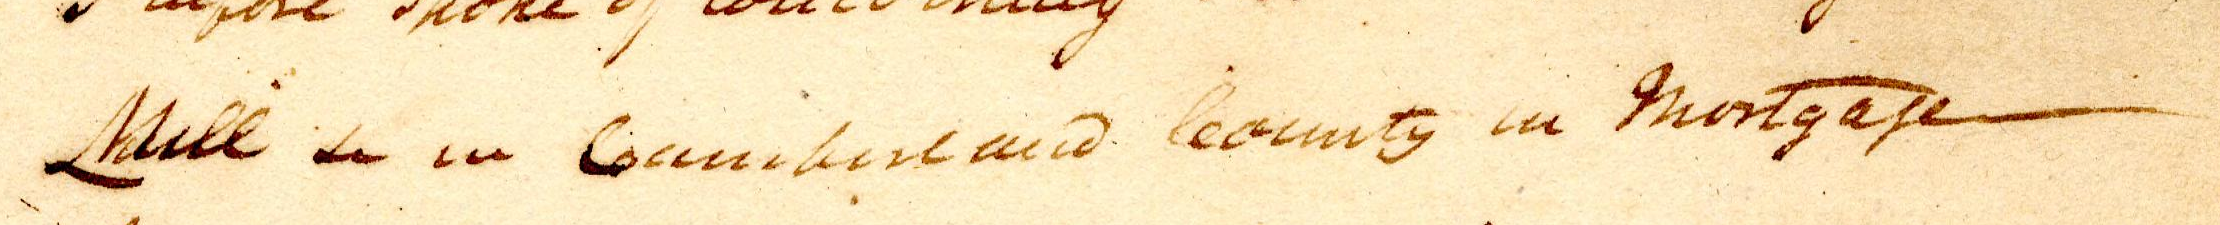Mill [__] in Cumberland County in Mortgage
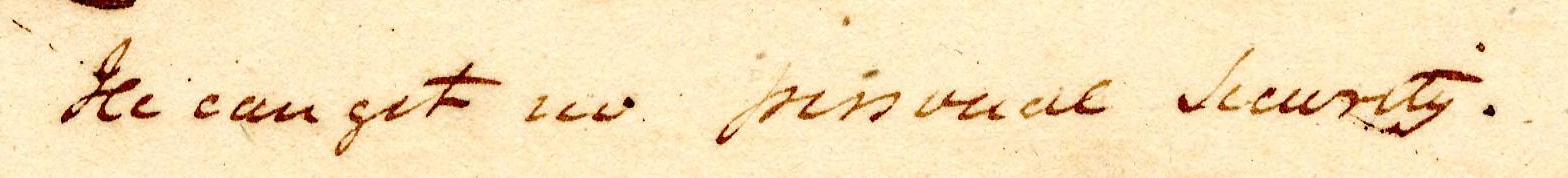He can get us personal security.
